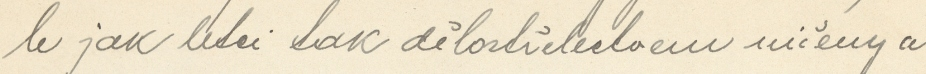le jak letci tak dělostřelectvem ničeny a
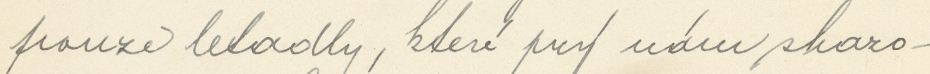pouze letadly, které prý nám shazo-
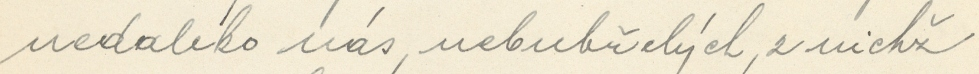nedaleko nás, nabubřelých, z nichž
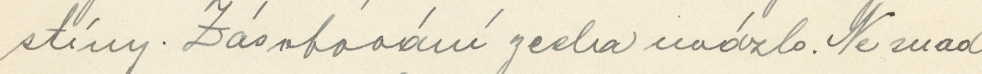stíny. Zásobování zcela uvázlo. Ne snad
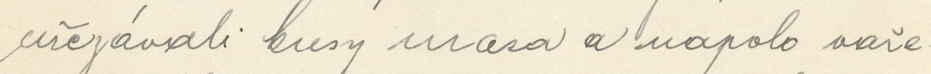uřezávali kusy masa a napolo vaře-
